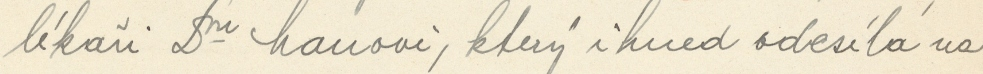lékaři Dr Manovi, který ihned odesílá na
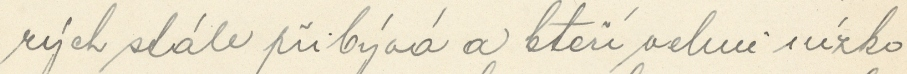rých stále přibývá a kteří velmi nízko
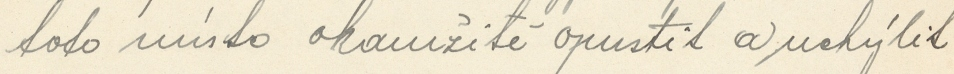toto místo okamžitě opustit a uchýlit
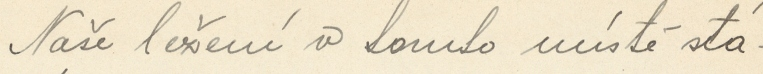Naše ležení v tomto místě stá-
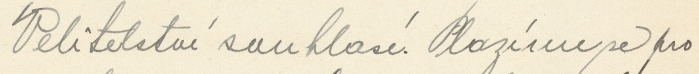Velitelství souhlasí. Plazíme se pro-
